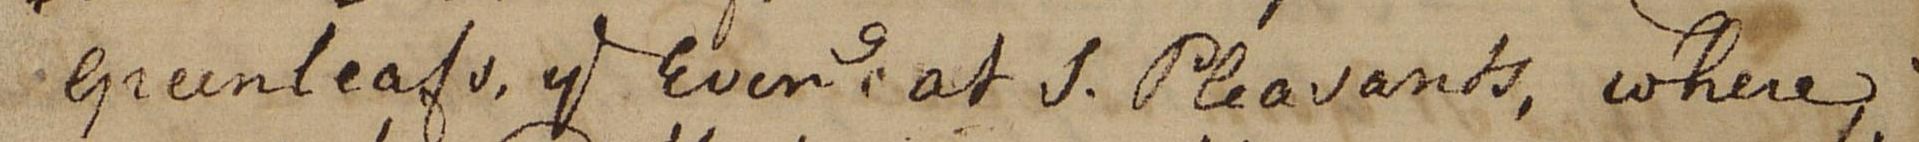Greenleafs, y^e Even^g. at S. Pleasants, where
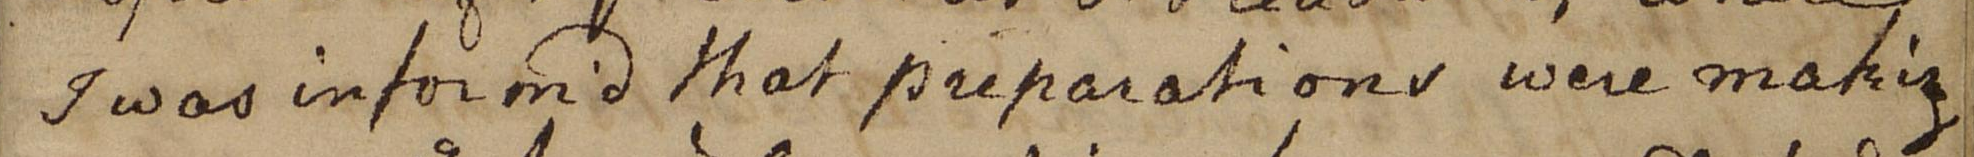I was inform'd that preparations were making
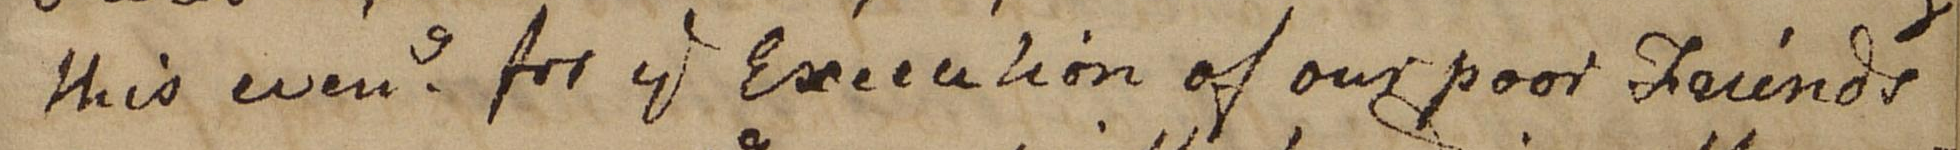this even^g. for y^e Execution of our poor Friends
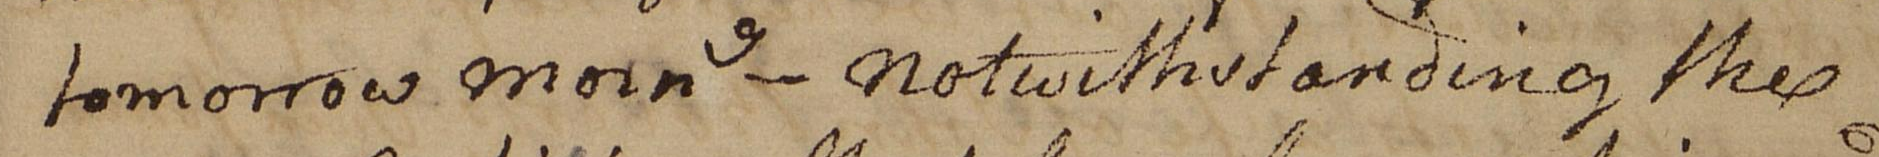tomorrow morn^g- notwithstanding the
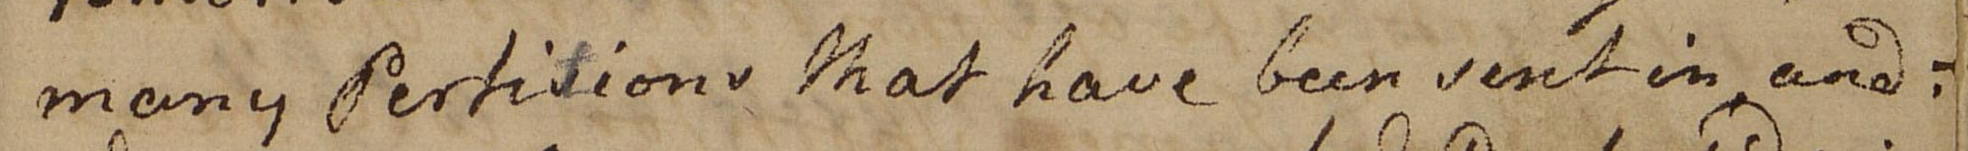many Pertisions that have been sent in, and
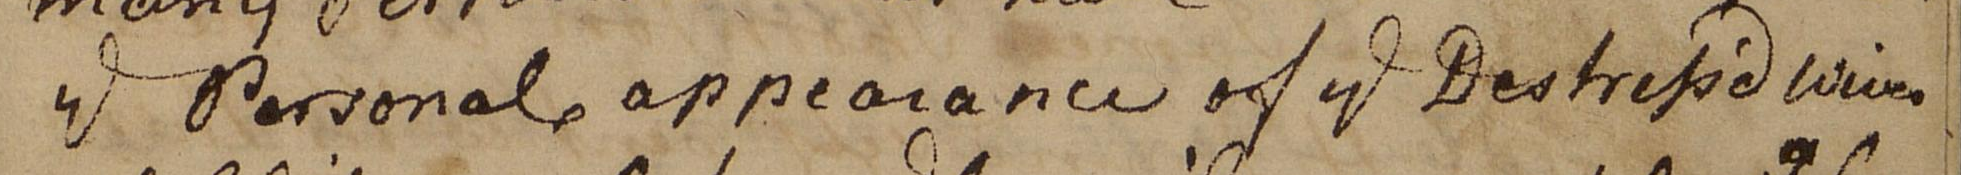y^e Personal appearance of y^e Destress'd wives
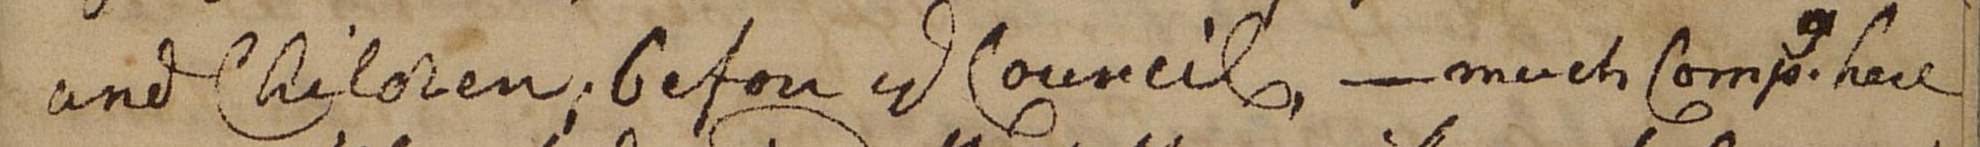and Children, before y^e Council,- much Comp^y. here
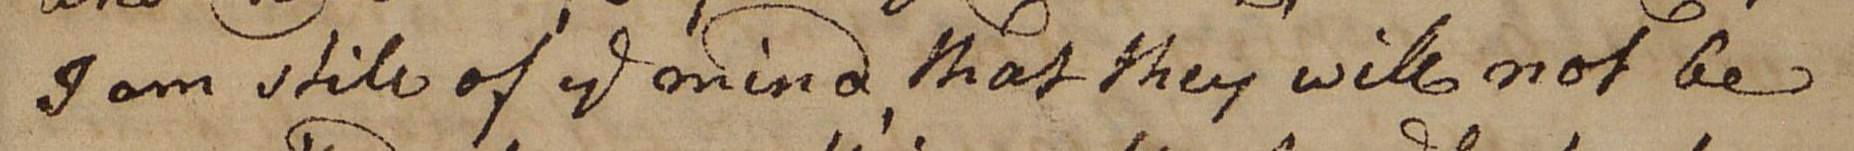I am still of y^e mind, that they will not be
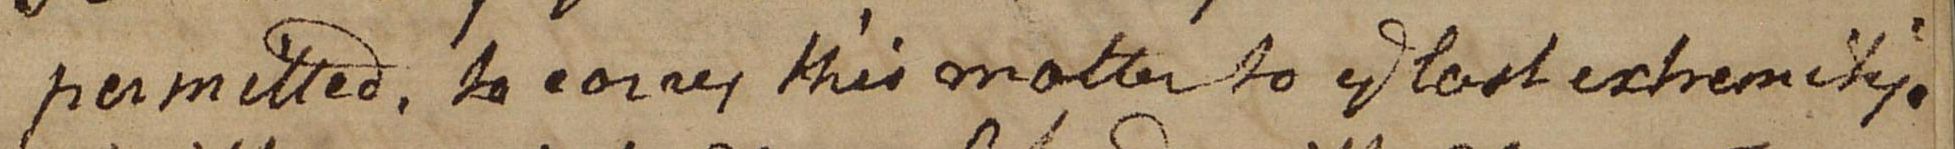permitted, to carry this matter to y^e last extremity.
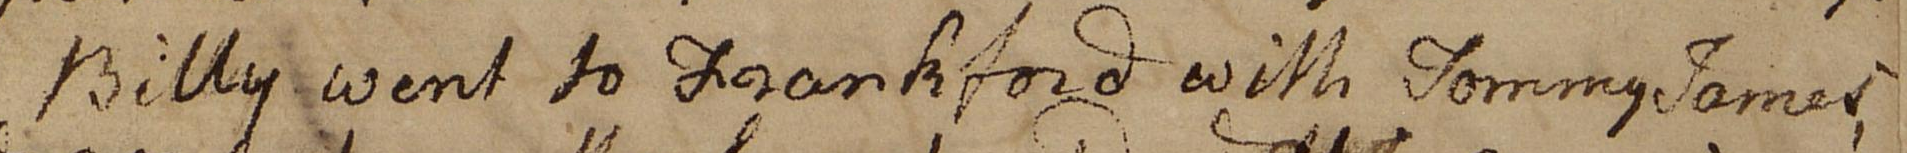Billy went to Frankford with Tommy James,
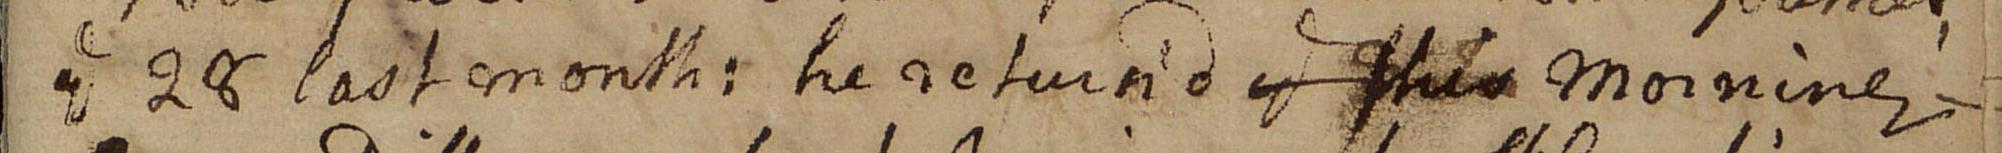y^e 28 last month; he return'd y^e this morning-
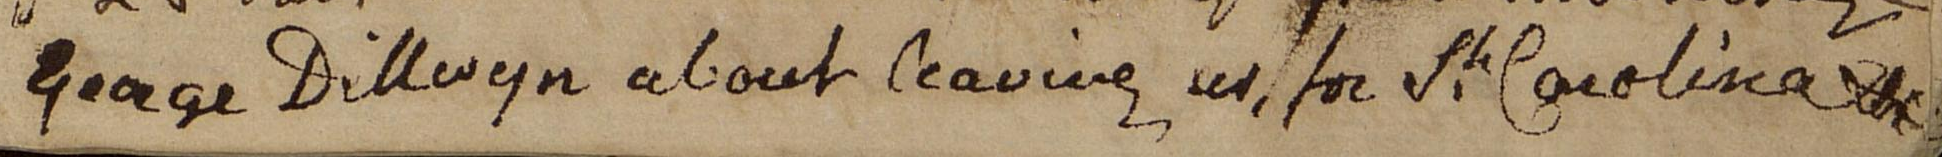George Dillwyn about leaving us, for S^h. Carolina
